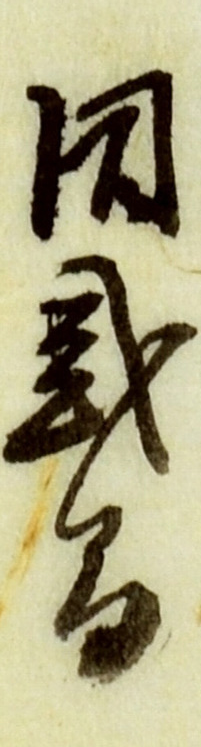同弐間
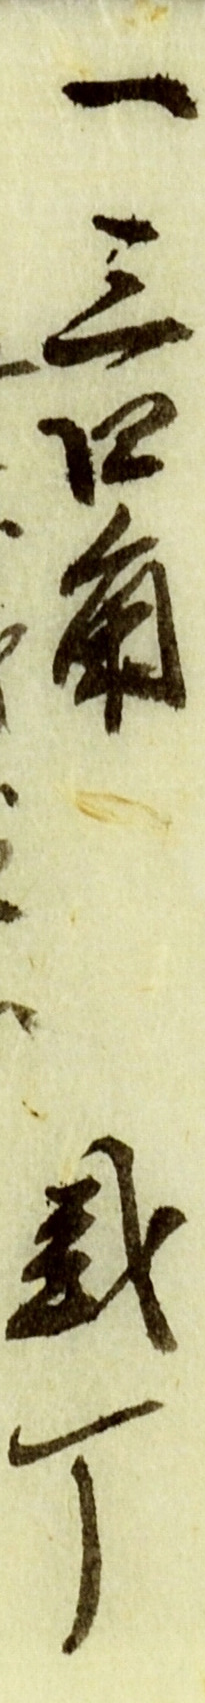一三四角弐丁
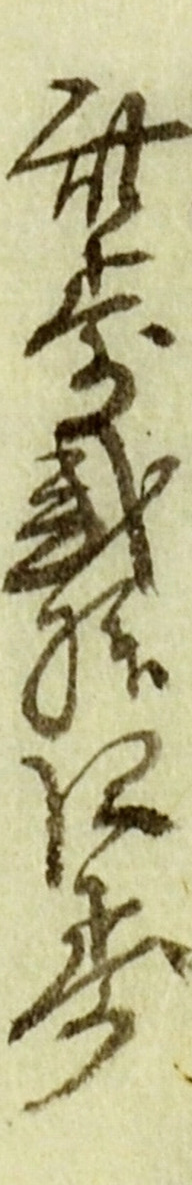此歩弐拾四歩
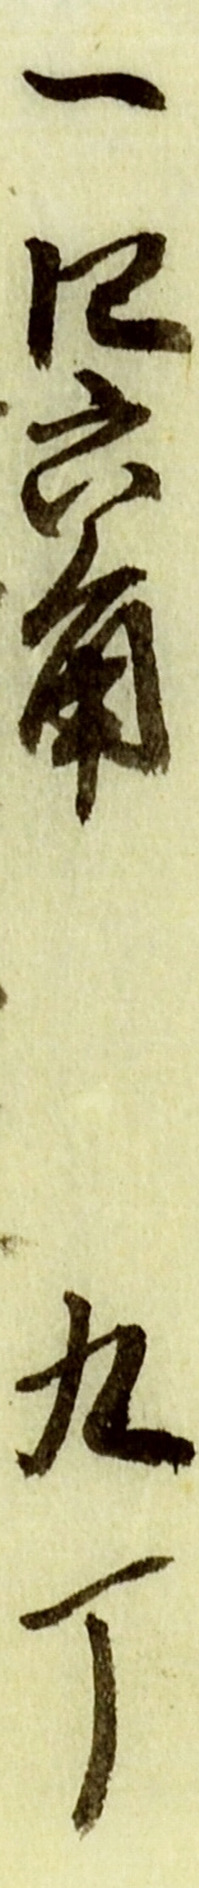一四六角九丁
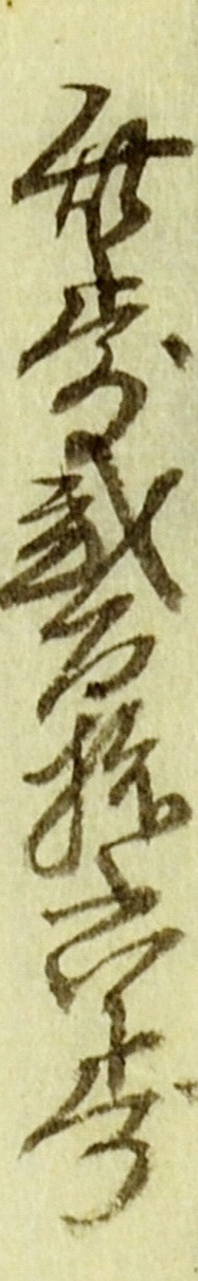此歩弐百拾六歩
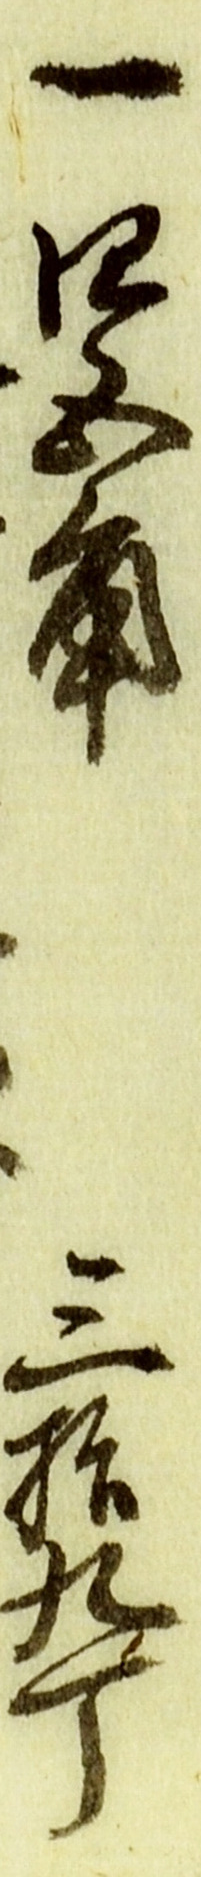一四五角三拾九丁
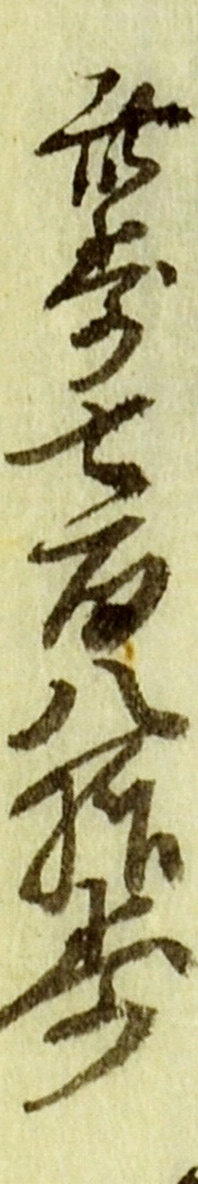此歩七百八拾歩
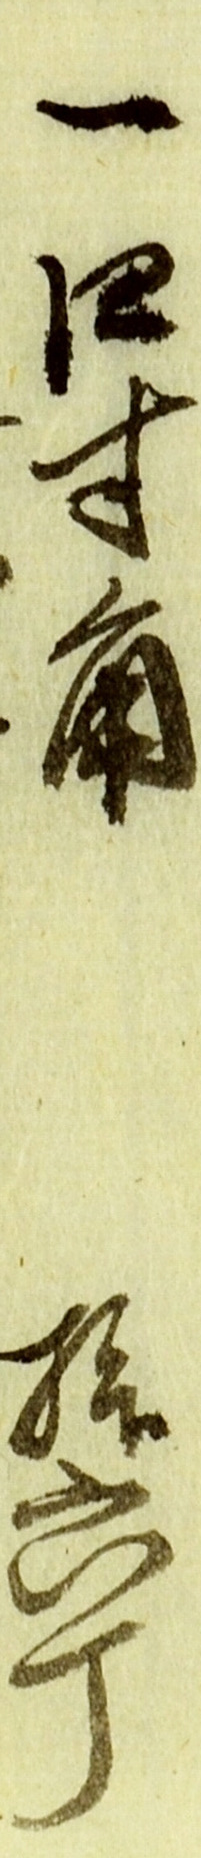一四寸角拾六丁
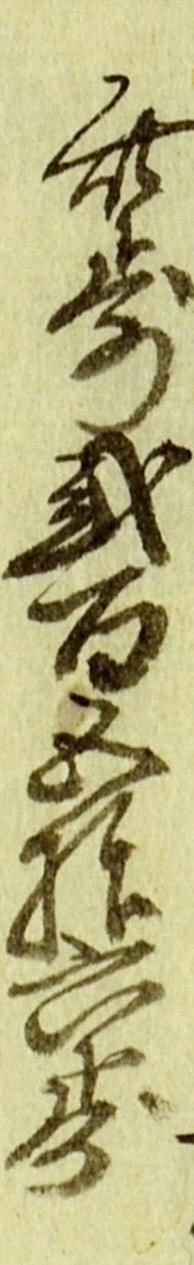此歩弐百五拾六歩
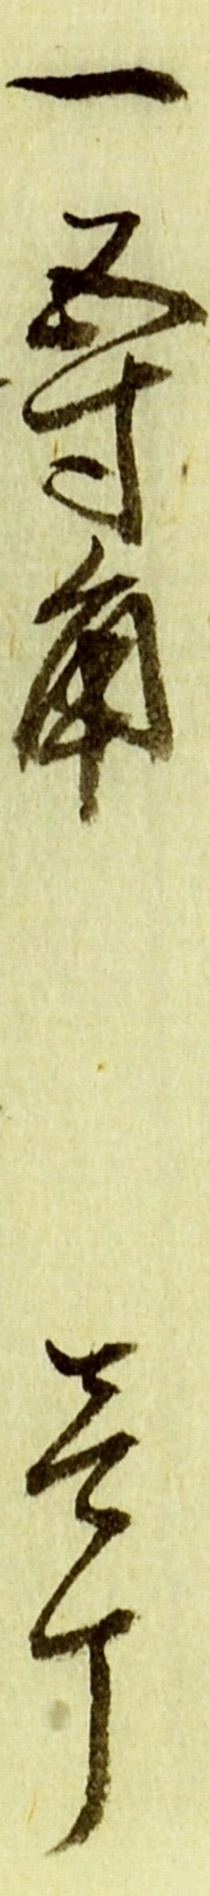一五寸角壱丁
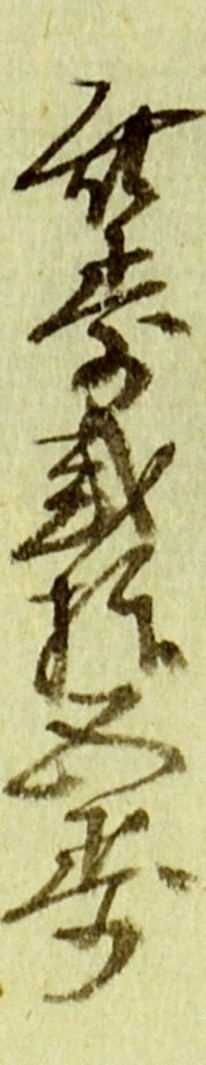此歩弐拾五歩
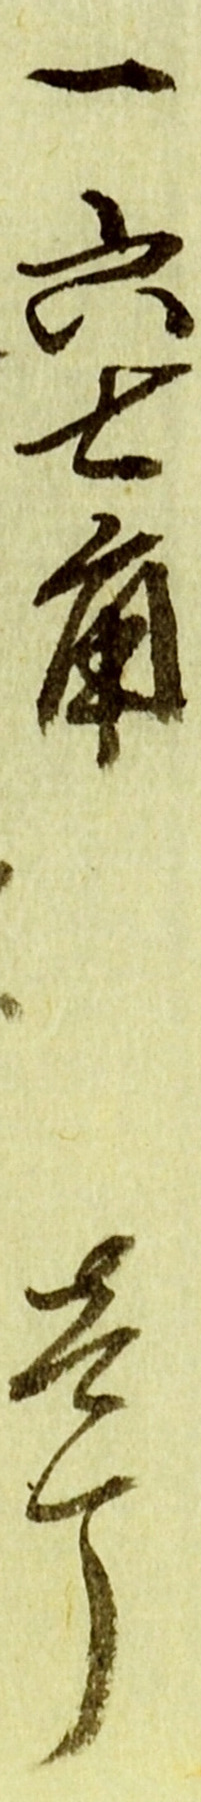一六七角壱丁
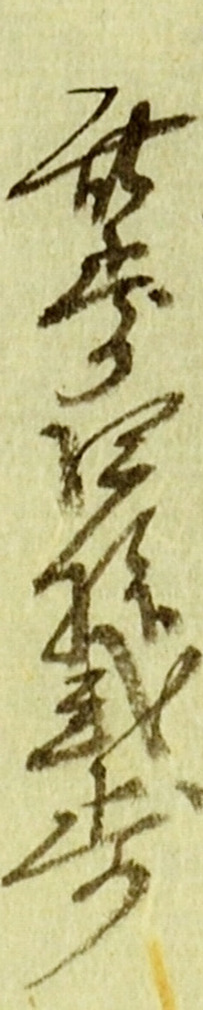此歩四拾弐歩
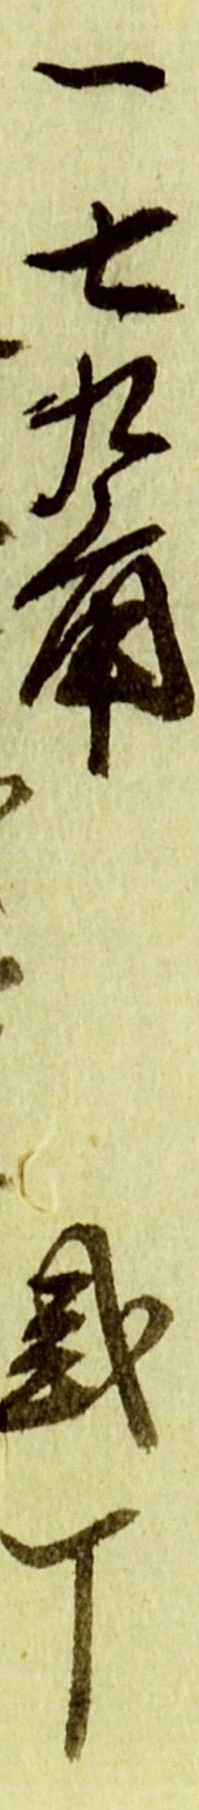一七九角弐丁
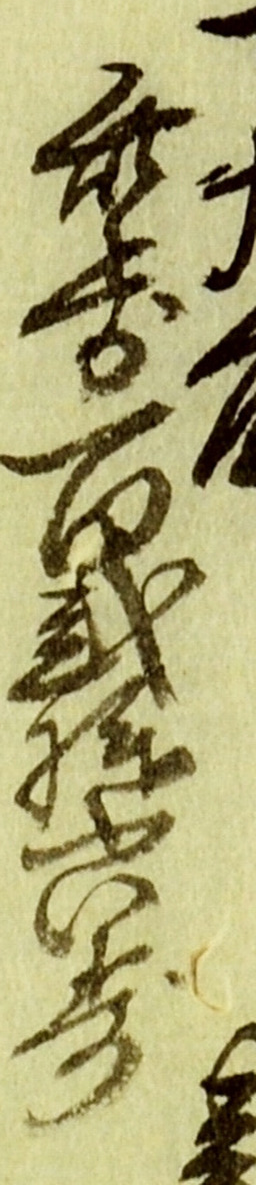此歩百弐拾六歩
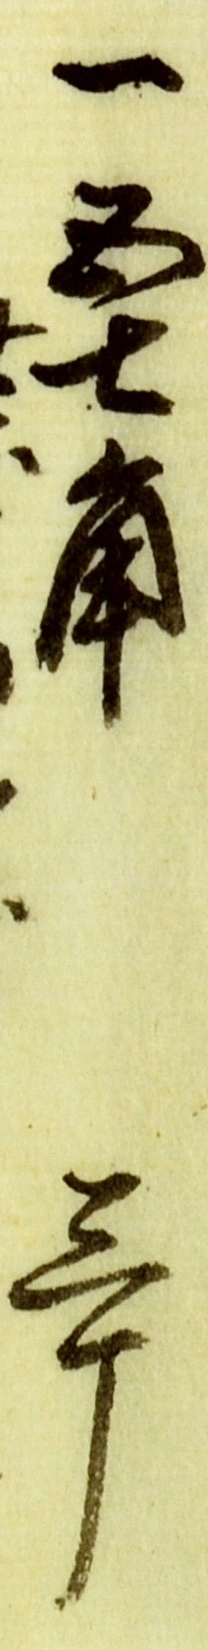一五七角三丁
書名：材木川下ケ分一上納帳
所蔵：伊那市立高遠町図書館・合同会社AMANE
